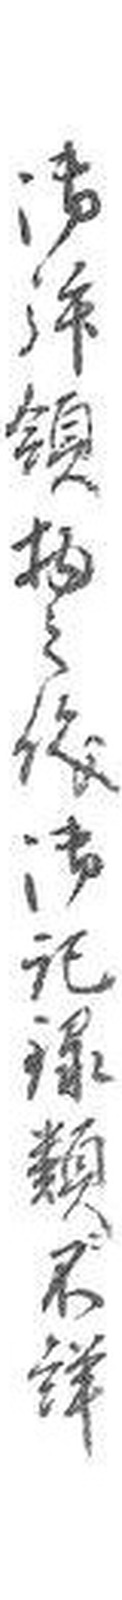御拝領物之儀御記録類ニ不詳
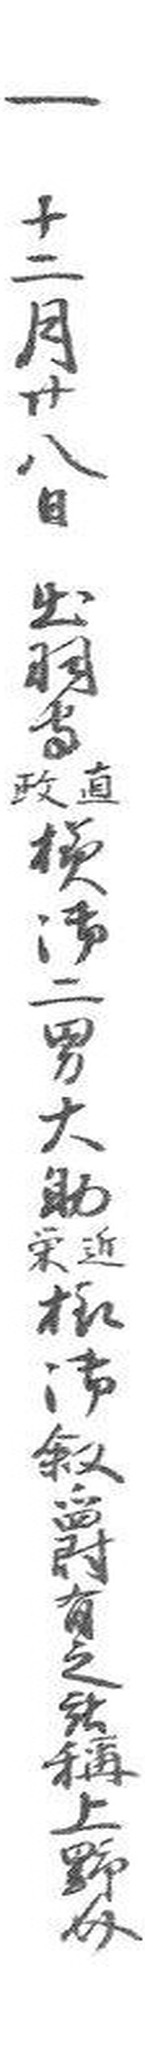一十二月廿八日出羽守直政様御二男大助近栄様御叙爵有之被称上
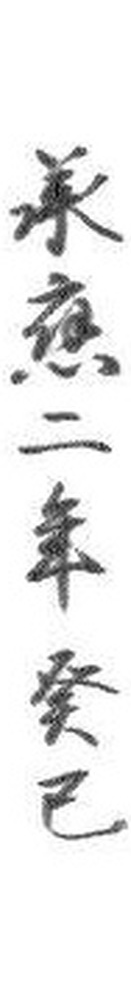承応二年癸巳
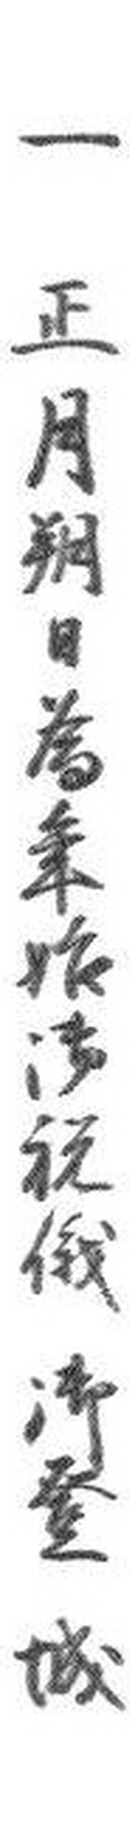一正月朔日年始御祝儀御登城
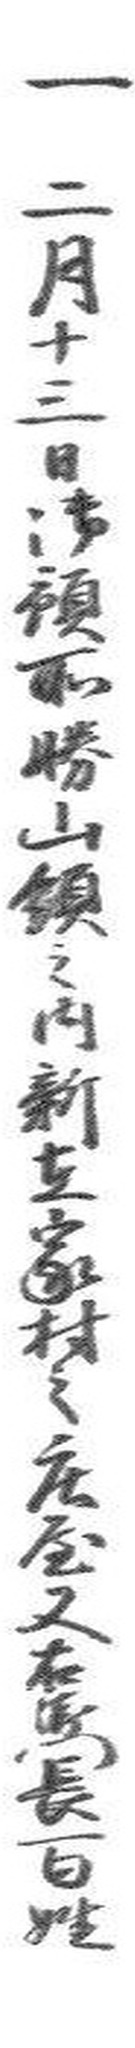二月十三日御預所勝山領之内新在家之村之庄屋又右衛門長百姓
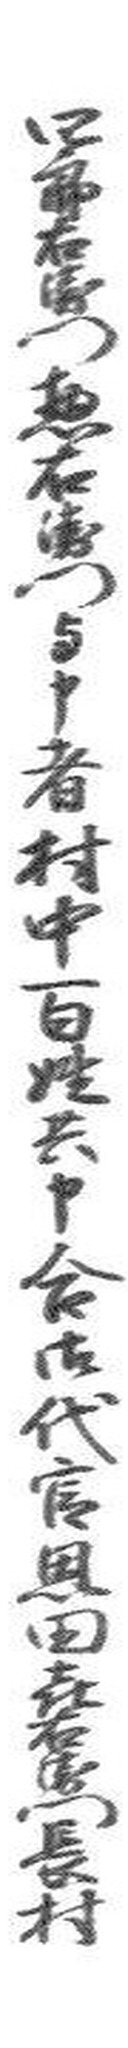四郎右衛門惣右衛門与申者村中百姓共申合御代官恩田喜右衛門
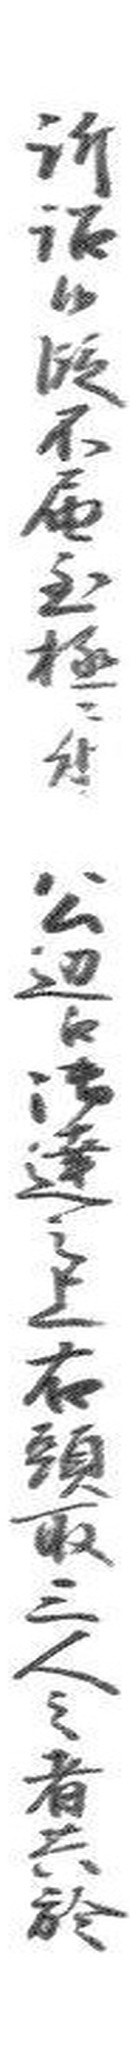訴訟候段不届至極ニ付公辺江御達之上右頭取三人之物共於
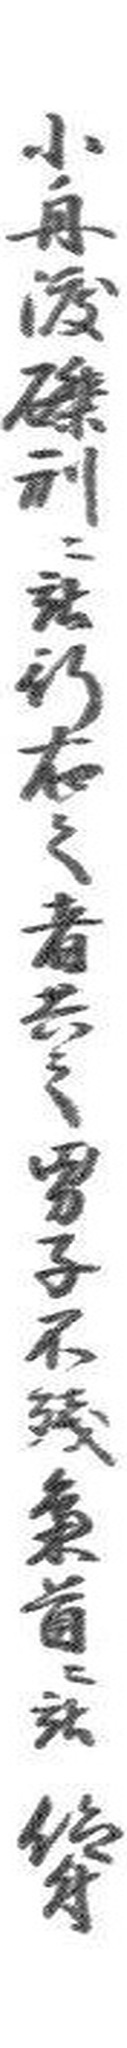小舟渡磔刑ニ被行右之者共之男子不残梟首ニ被仰付
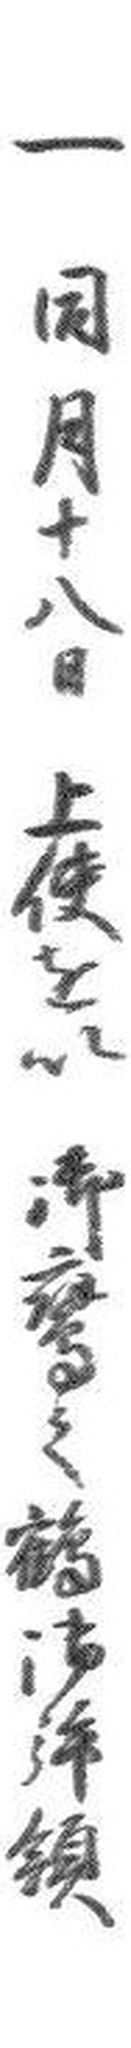一同月十八日上使を御鷹之鶴御拝領

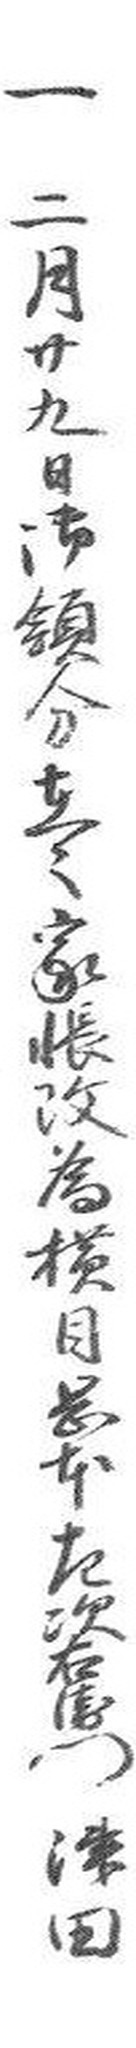一二月廿九日御領分在々家帳改為横目岡本左次右衛門津田
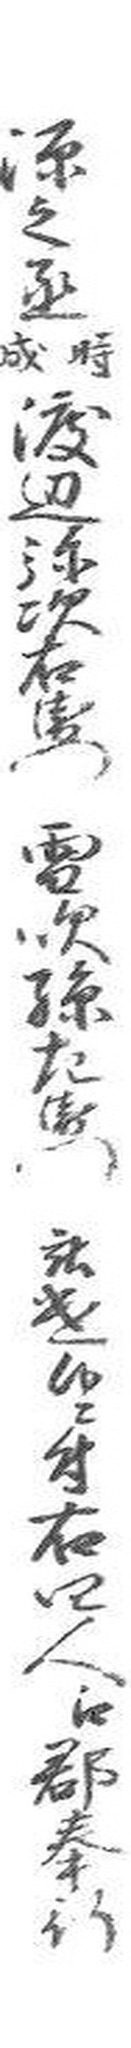源之丞時成渡辺弥次右衛門雪吹孫左衛門被遣候ニ付右四人江
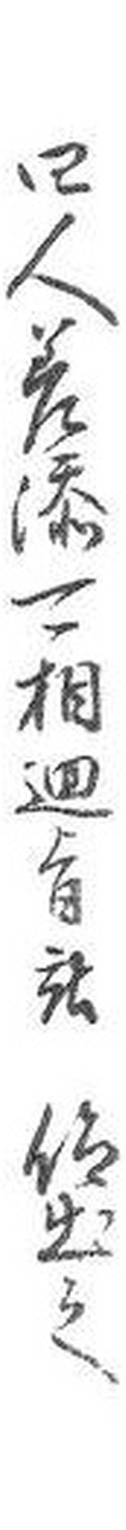四人差添可相廻旨被仰出之
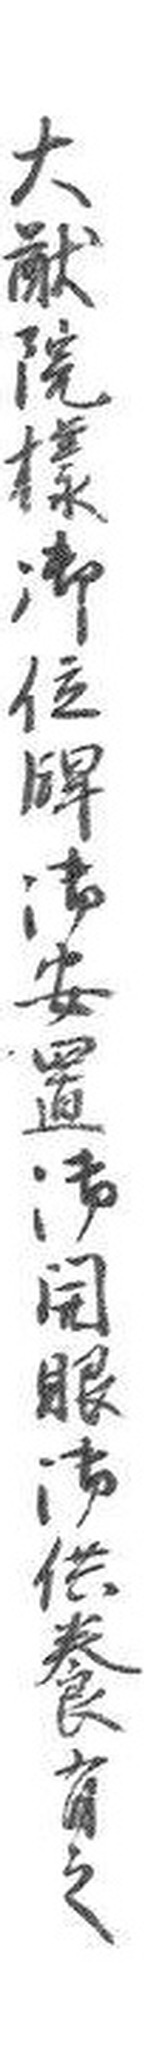大猷院様御位牌御安置御開眼御供養有之
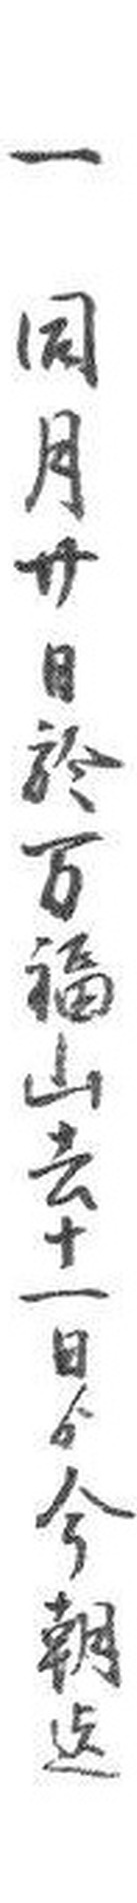一同月廿日於万福山去十一日ゟ今朝迄
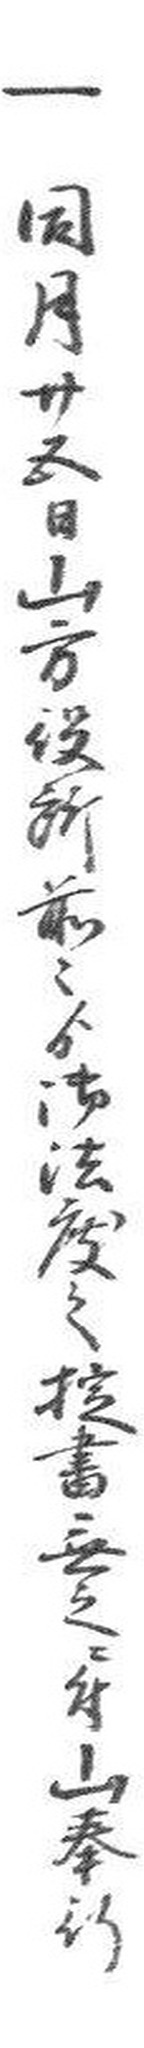一同月廿五日山方役所前々ゟ御法度之掟書無之ニ付山奉行
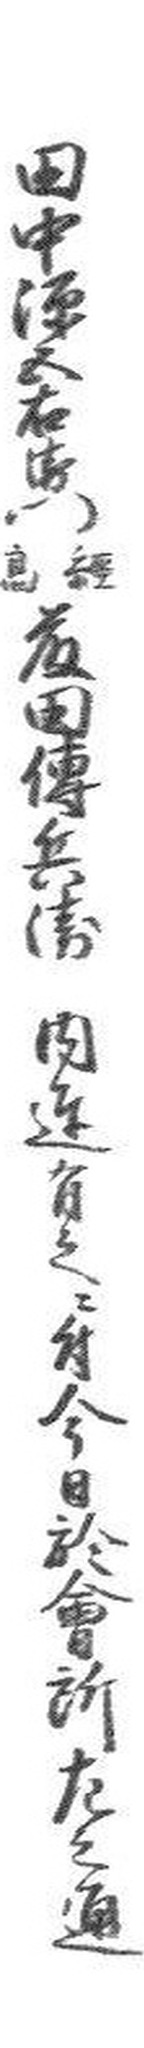田中源五右衛門経高藤田伝兵衛内達有之ニ付今日於会所左之通
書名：家譜 五 光通公 従寛永十三年到万治二年
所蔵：福井県文書館 Fukui Prefectural Archives
